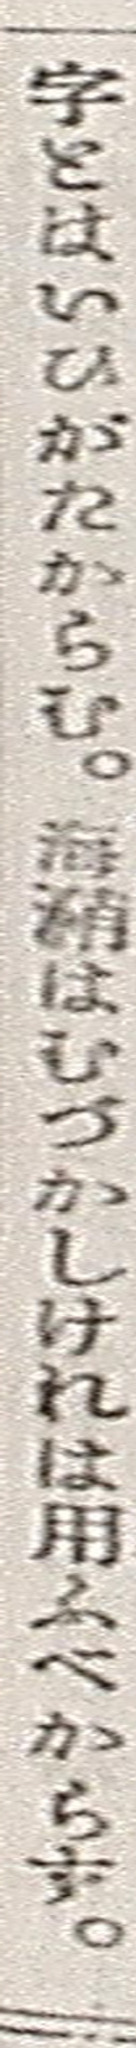字とはいひがたからむ。海𣹝はむづかしけれは用ふべからず。
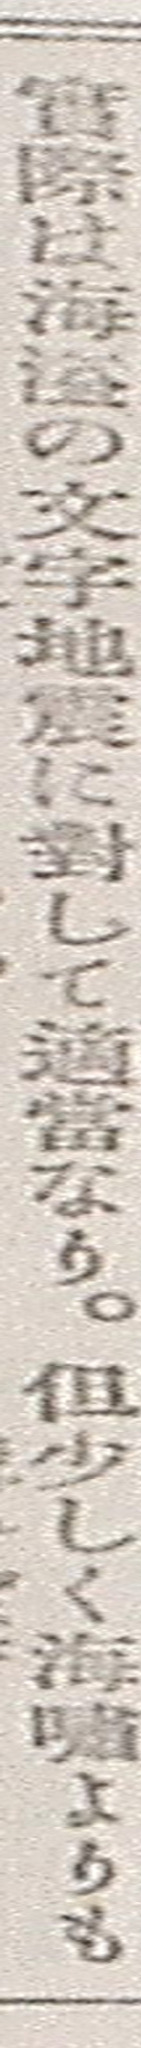実際は海溢●●の文字地震に対して適当なり。但少しく海嘯よりも
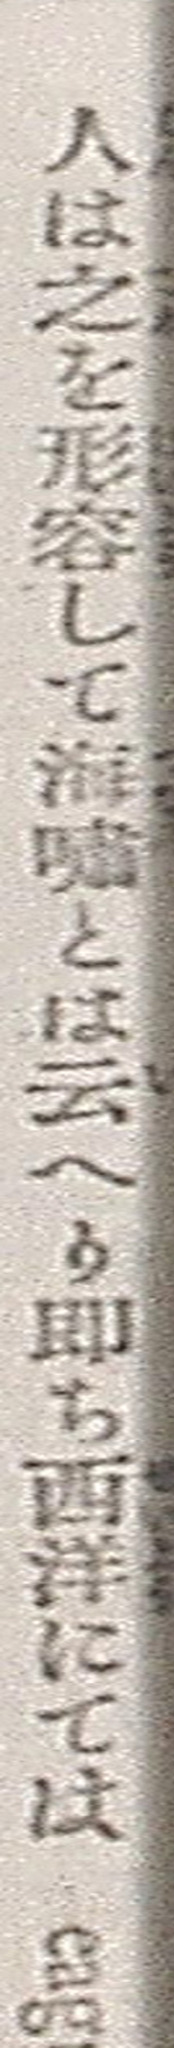人は之を形容して海嘯とは云へり即ち西洋にては
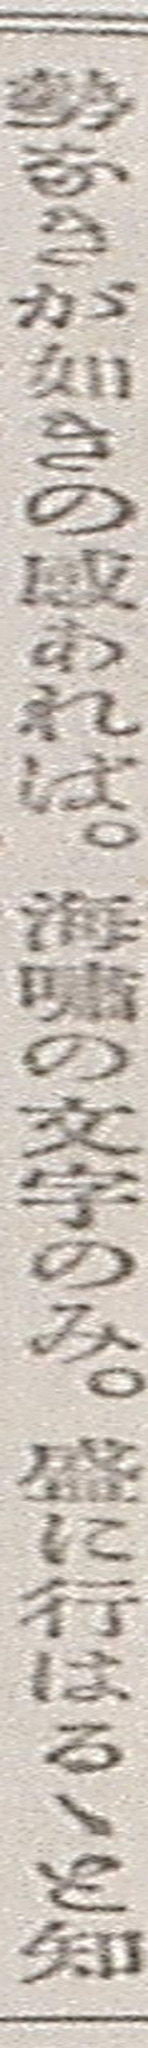勢なきが如きの感あれば。海嘯●●の文字のみ。盛に行はるゝと知
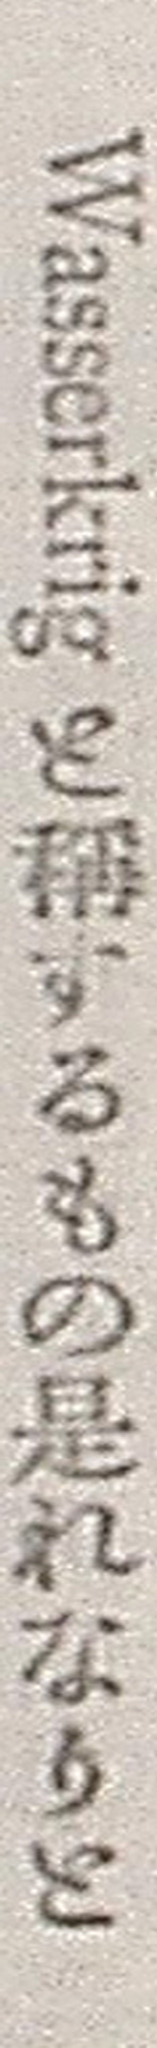と称するもの是れなりと
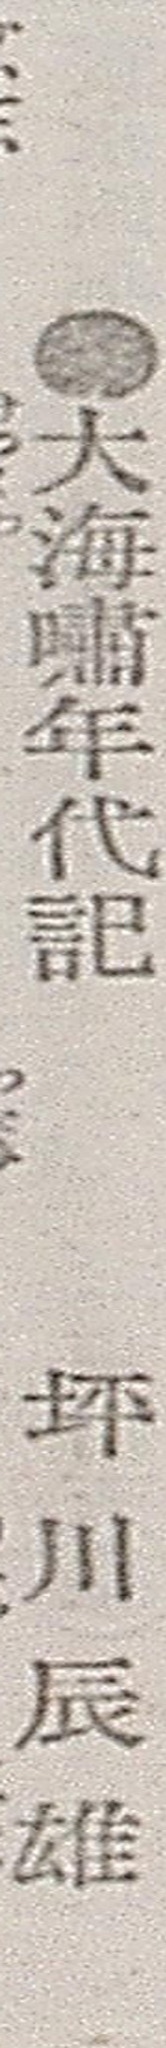●大海嘯年代記坪川辰雄
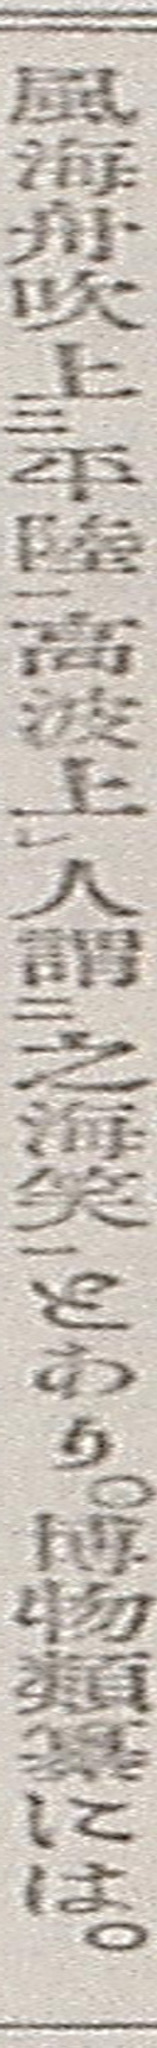風海舟吹上平陸高波上人謂之海笑●●とあり。博物類纂には。
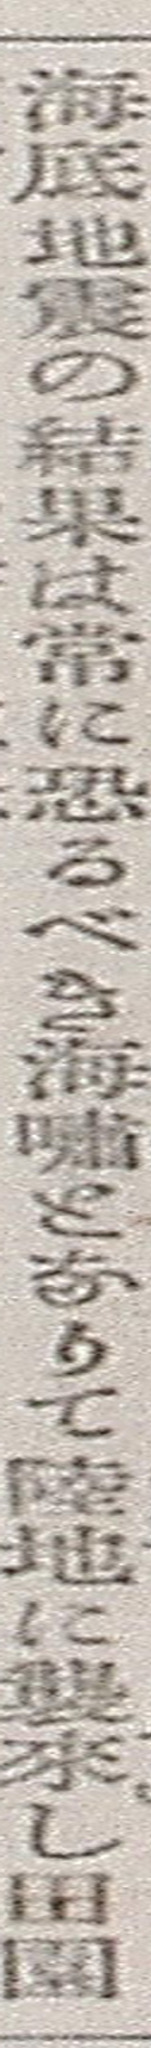海底地震の結果は常に恐るべき海嘯となりて陸地に襲来し田園
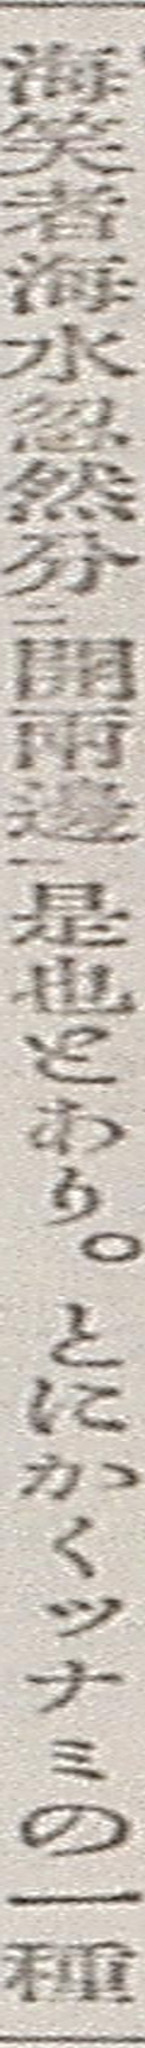海笑●●者海水忽然分開両辺是也とあり。とにかくツナミの一種
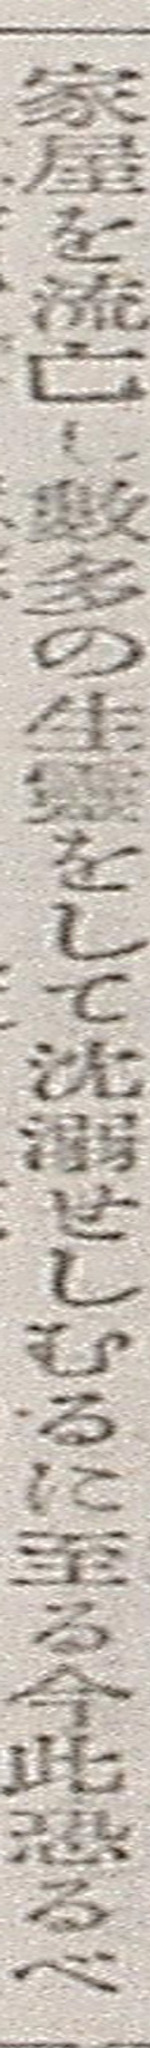家屋を流亡し数多の生霊をして沈溺せしむるに至る今此恐るべ
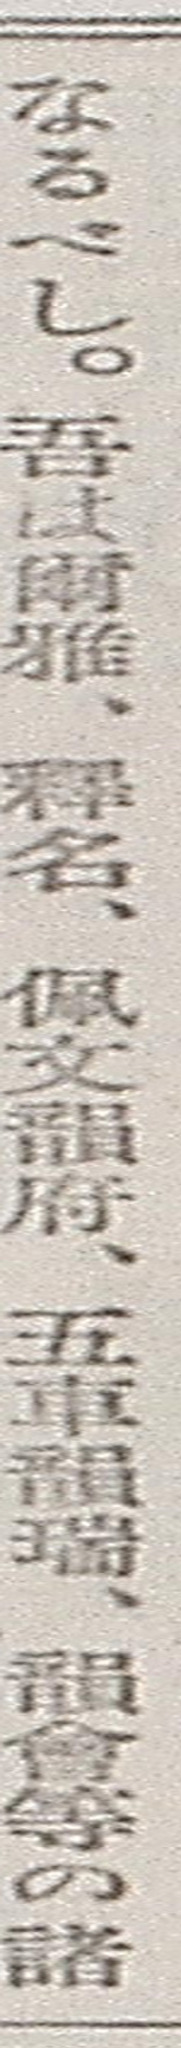なるべし。吾は爾雅、釈名、佩文韻府、五車韻瑞、韻会等の諸
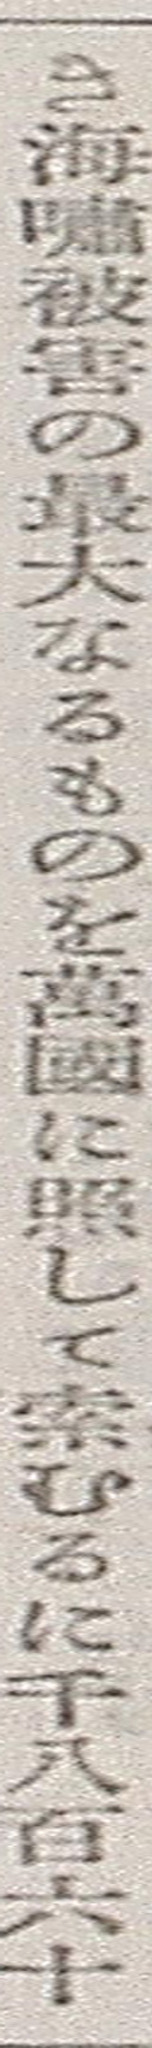き海嘯被害の最大なるものを万国に照して索むるに千八百六十
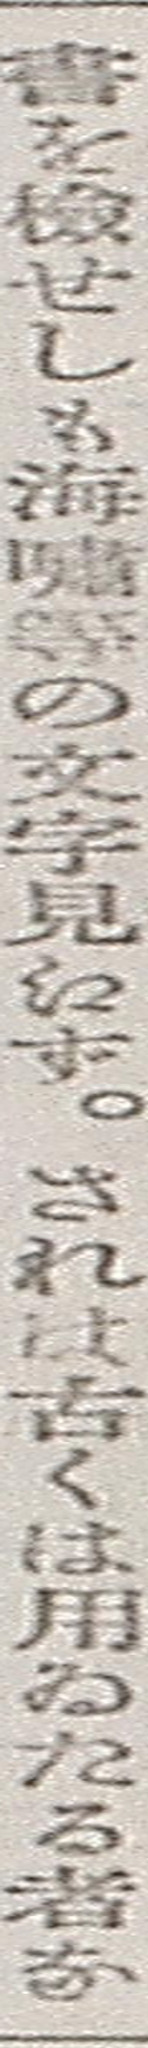書を検せしも海嘯●●等の文字見えず。されば古くは用ゐたる者な
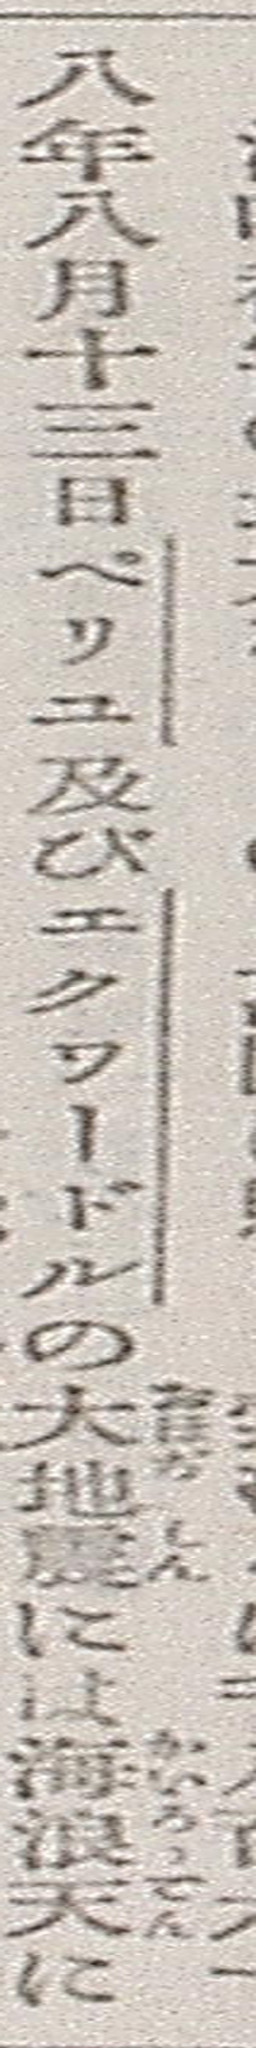八年八月十三日ペリユ及びエクワードルの大地震には海浪天に
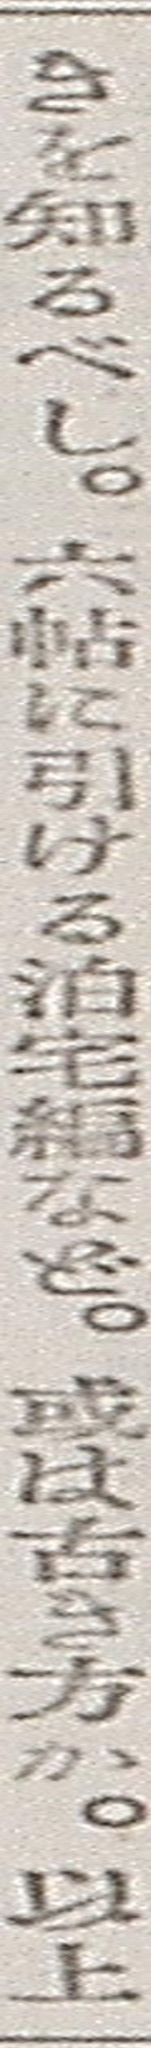きを知るべし。六帖に引ける泊宅編など。或は古き方か。以上
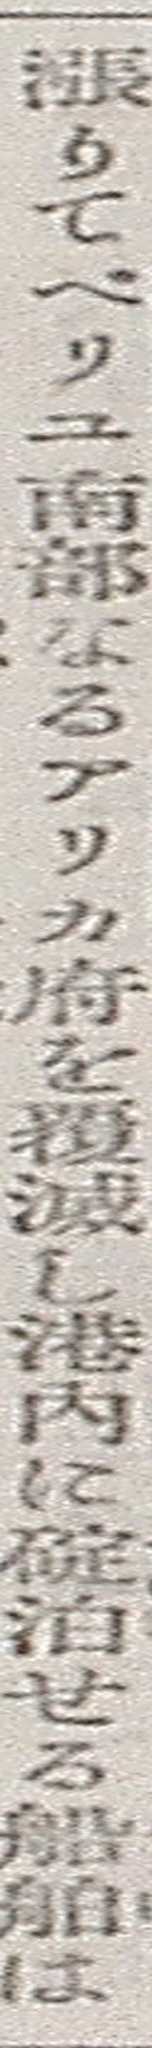漲りてペリユ南部なるアリカ府を覆滅し港内に碇泊せる船舶は
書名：風俗畫報臨時増刊第百二十號　大海嘯被害録（下）
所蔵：東京大学地震研究所図書室 Earthquake Research Institute Library, The University of Tokyo, JAPAN
